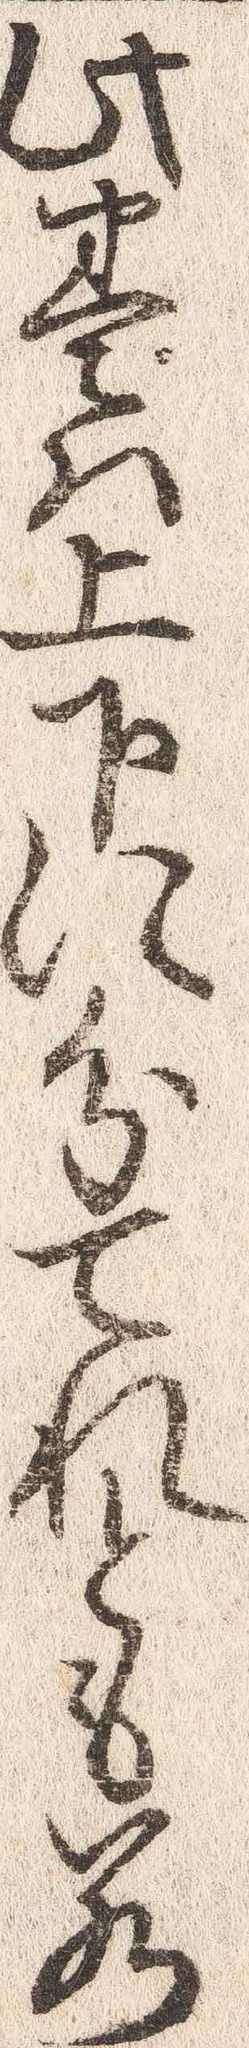此巻は上下に分てれとも若
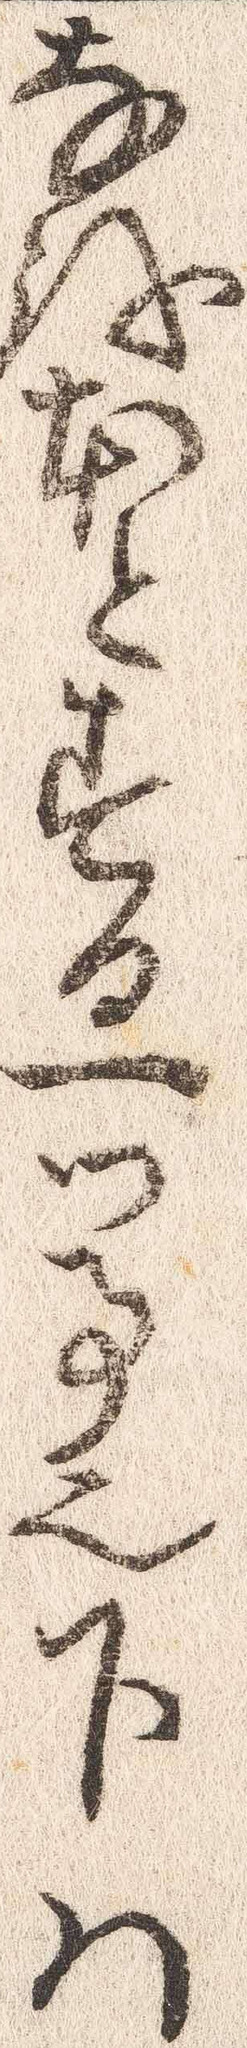なを本とする一つ事也下は
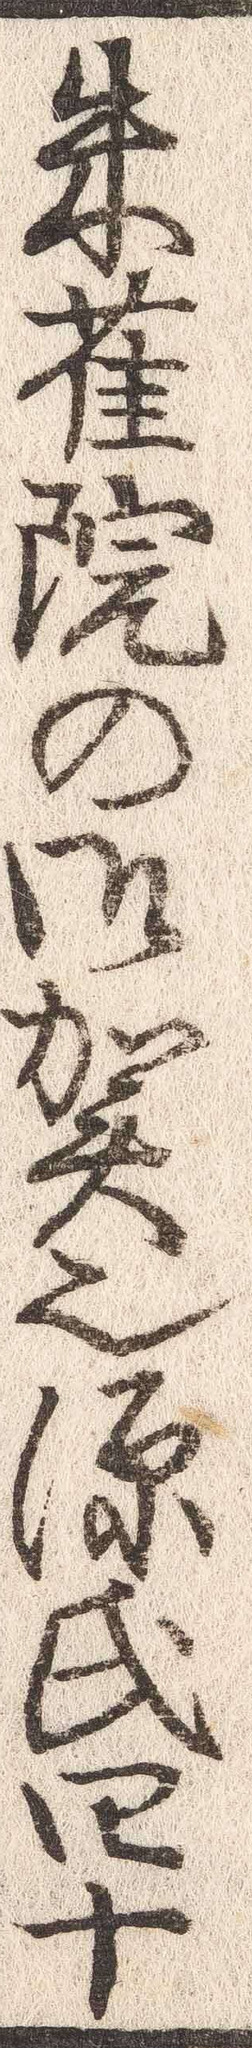朱萑院の御賀也源氏四十
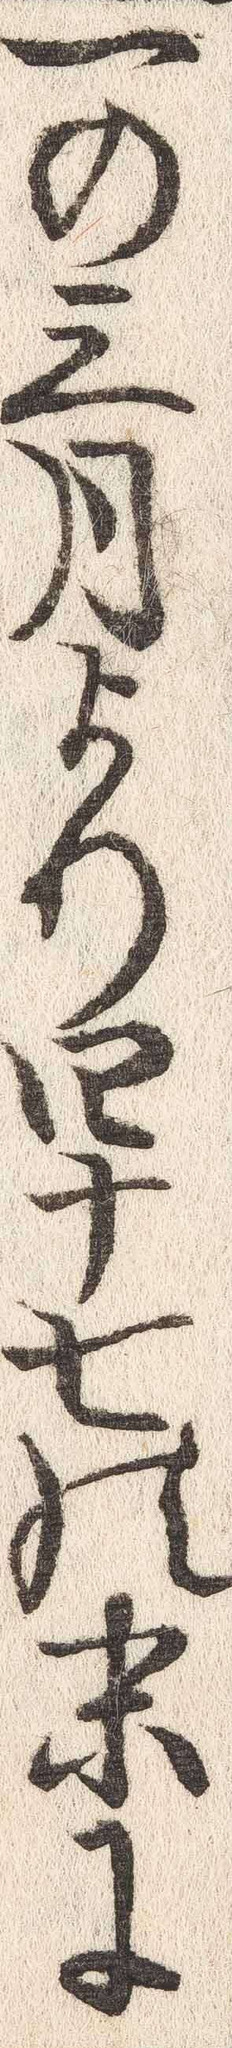一の三月より四十七の末に
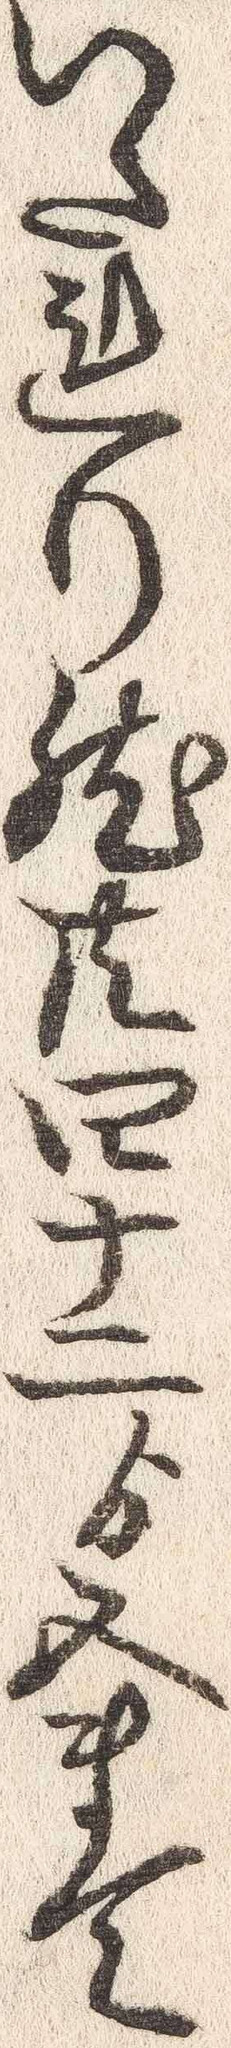いたれり然共四十二より五まて
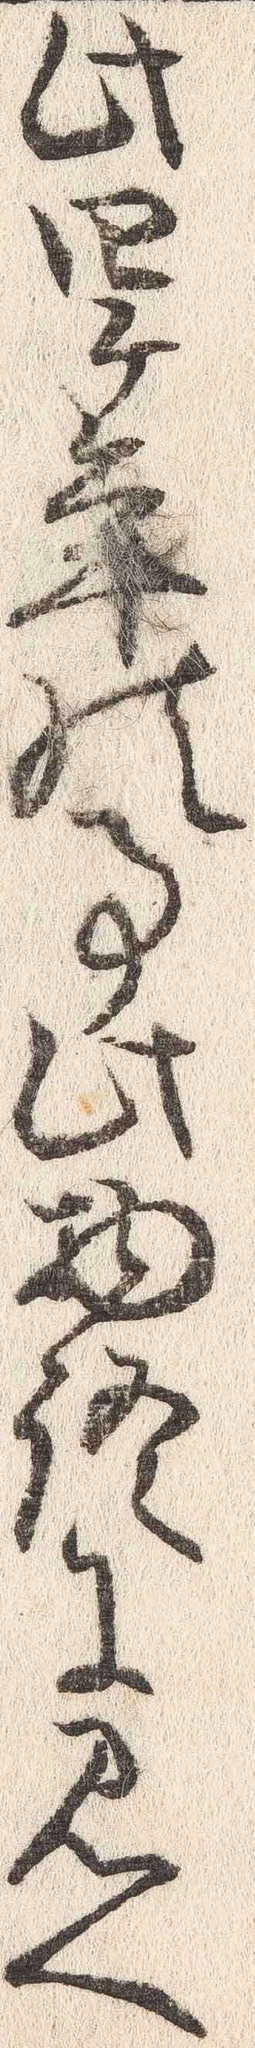此四ヶ年の事此物語に見へ
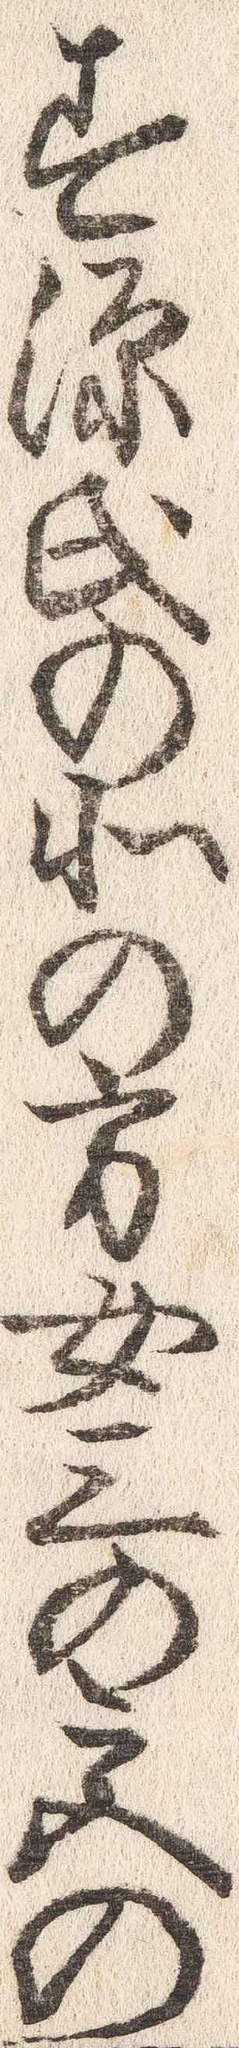す源氏の北の方女三の宮の
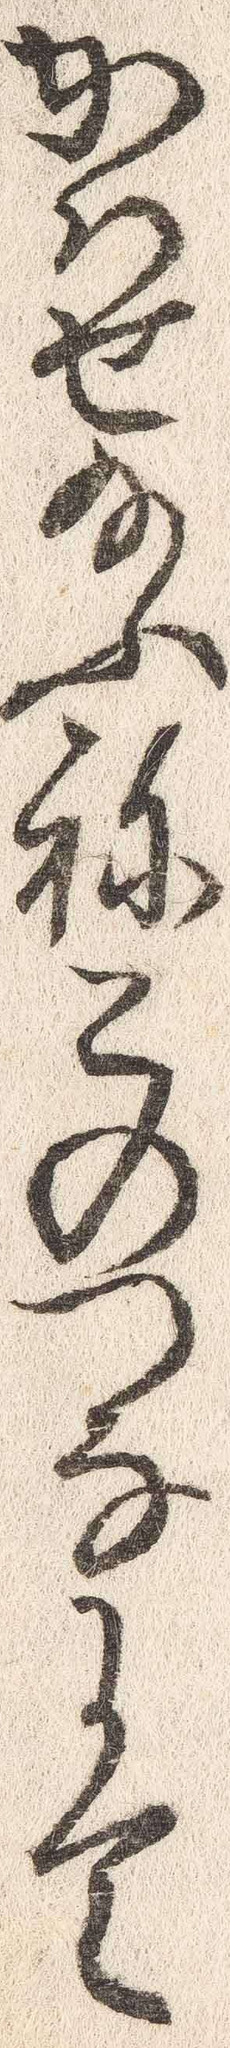かはせ給ふねこのつなにて

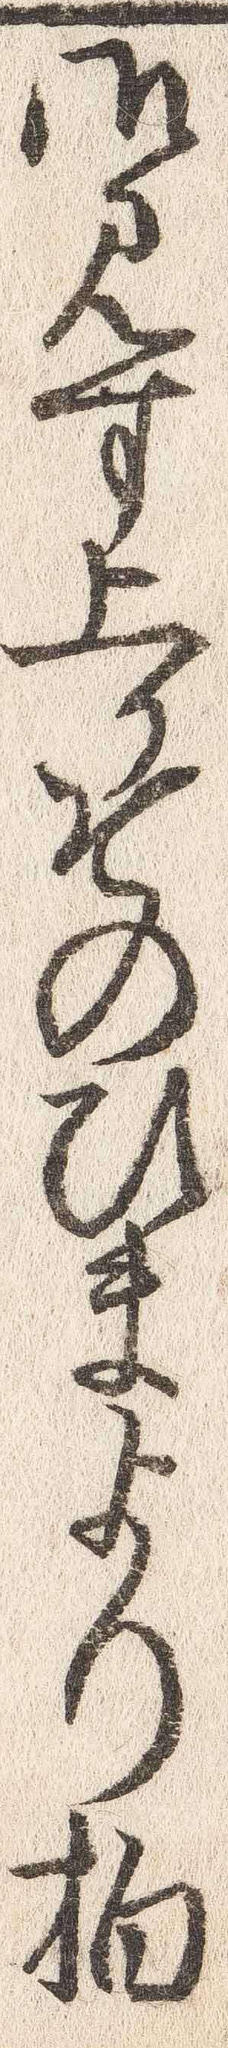御みす上りそのひまより柏
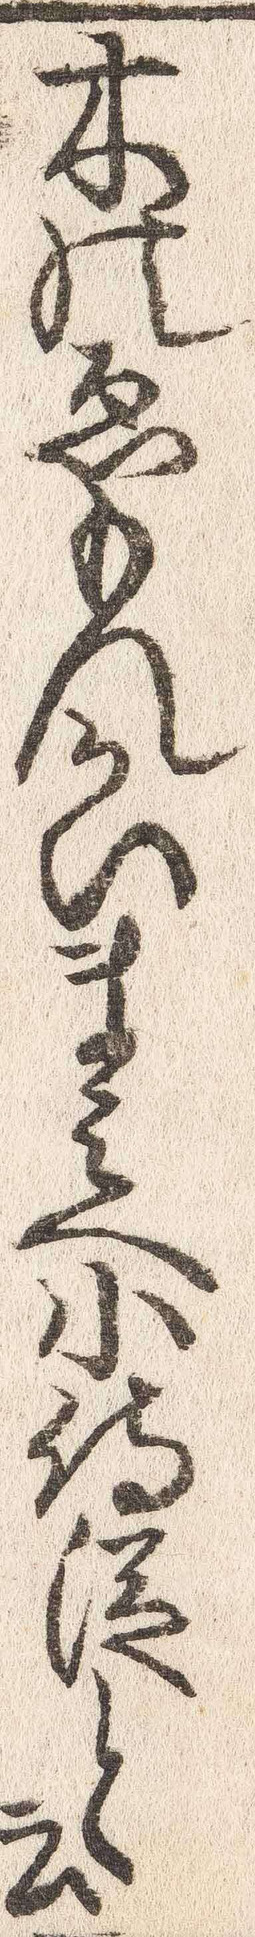木のゑもんかいまみへ小侍従と云
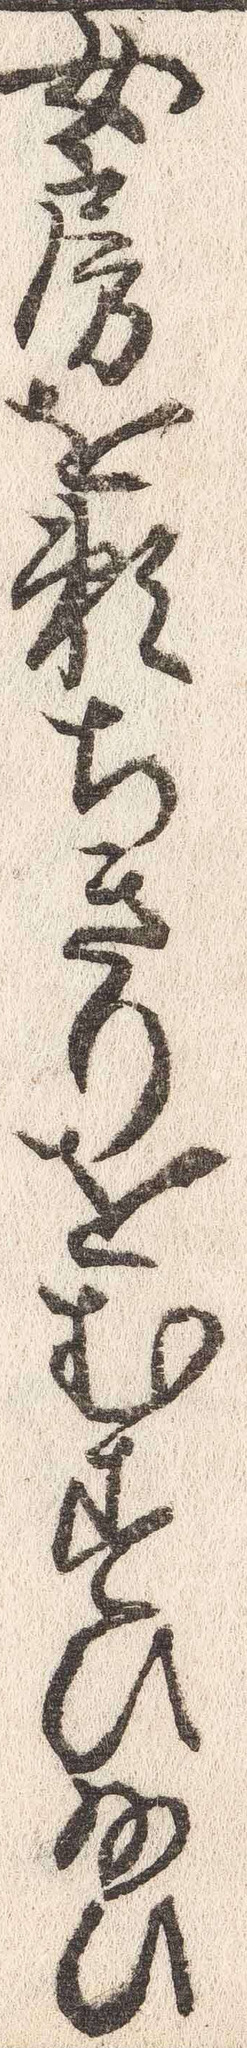女房を頼ちきりをむすひ給ひ
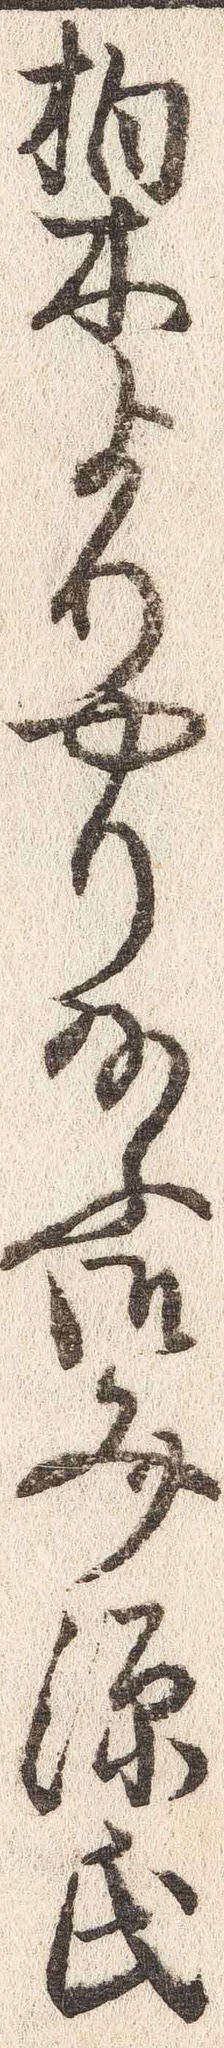柏木よりやり給ふ御文源氏
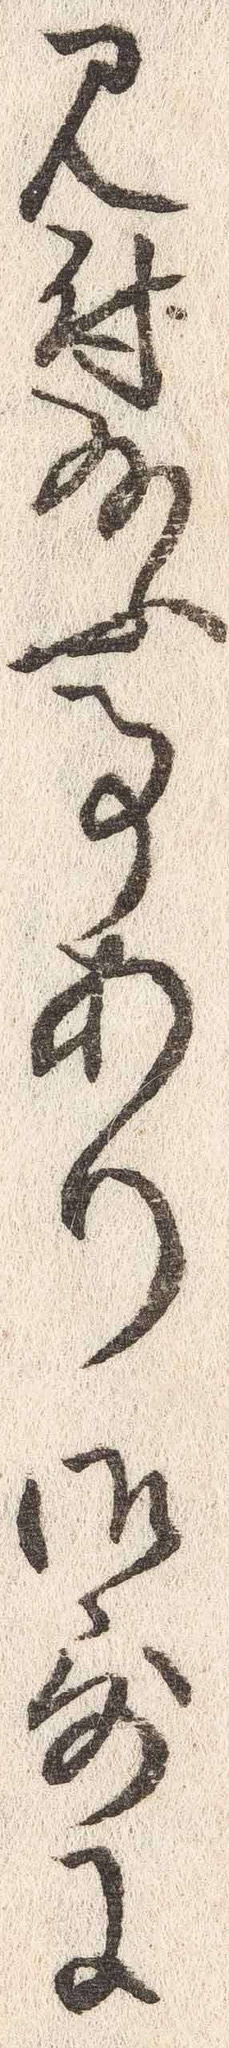見付給ふ事あり御哥に
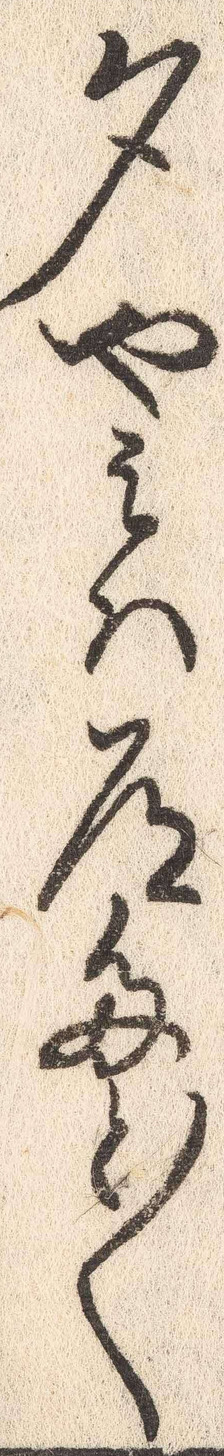夕やみは道たと〳〵
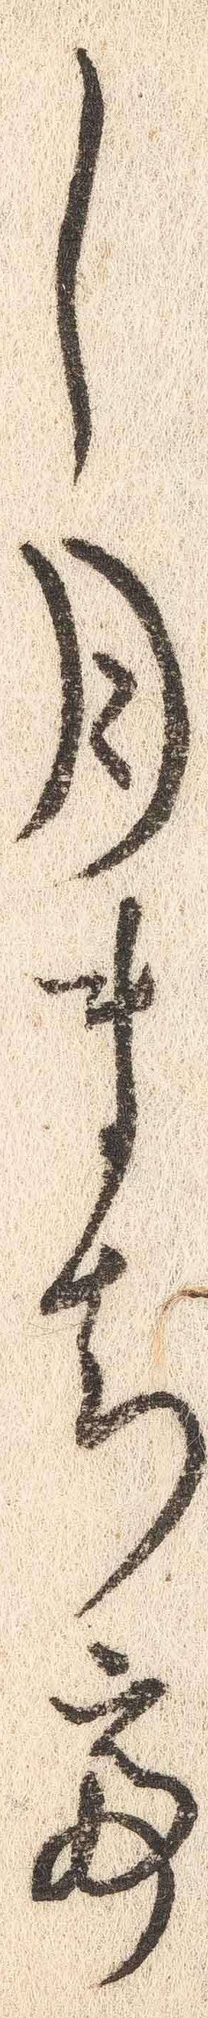し月まちて
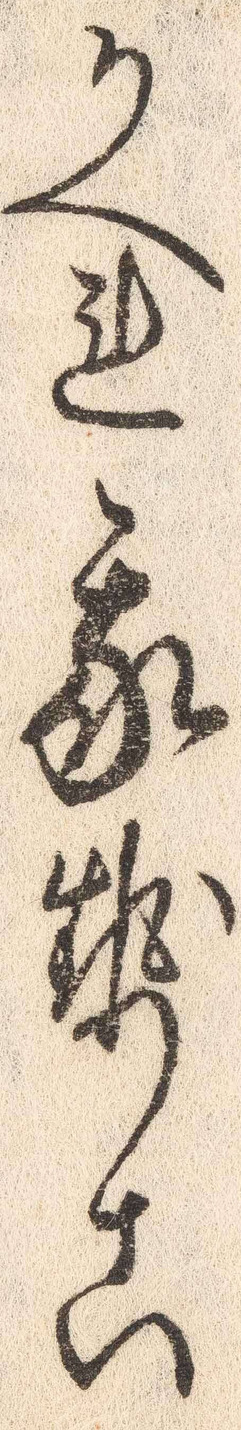かへれ我せこ
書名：源氏物語
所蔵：東京学芸大学附属図書館 国文学研究資料館
